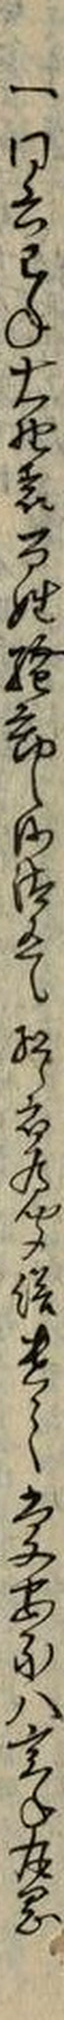一同六巳年大野表百姓騒動之沙汰有之組之者為聞繕遣之尚又安永八亥年丸岡
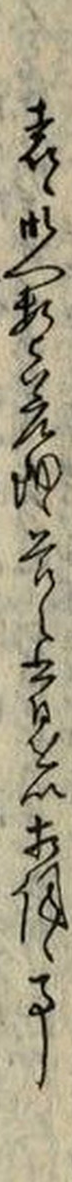表へ御人数被差越候節之書付を以相調候事
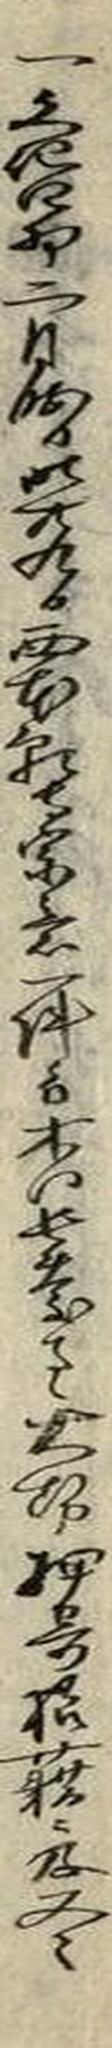一文化四卯二月晦日昨廿九日西本願寺宗意一件ニ付木田長慶寺へ大勢押寄狼藉ニ及又々
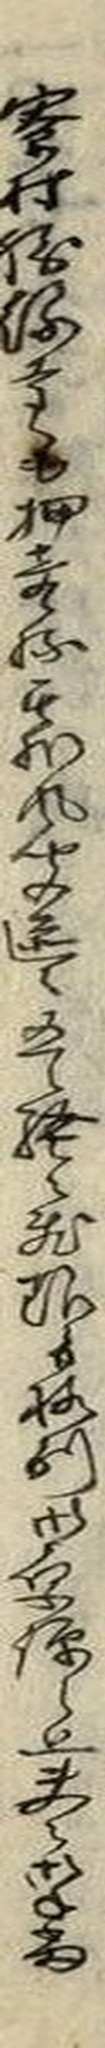寮村勝縁寺へも押寄候様其外風聞区々有之騒々敷趣ニ付格別御早評之上夫々御手当
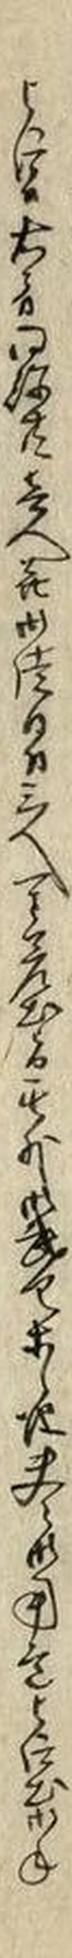被仰付右ニ付同役共壱人幷御徒目付三人可差出旨其外御武具等之儀夫々御用意被仰出御手
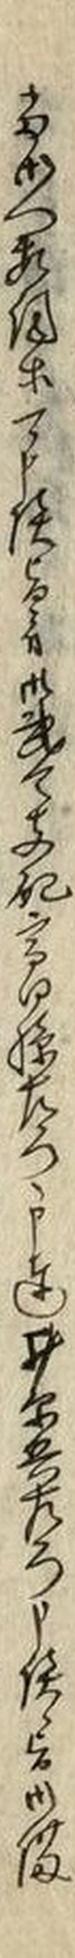当御人数調等可申談旨ニ付御武具支配高田孫左衛門へ申達井原兵左衛門申談候旨御備
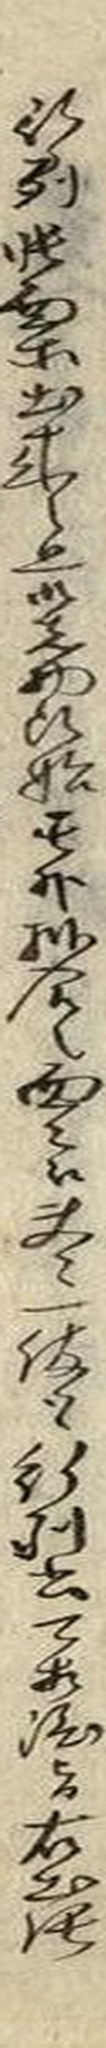行列帳面等出来之上御先物頭始其外掛合之面々江夫々一備ツヽ行列書相渡旨右出張
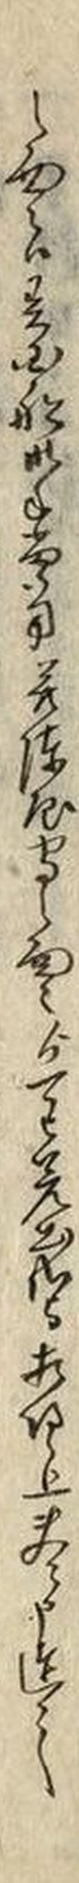之面々ハ異国船御手当御用幷陣屋守之面々ゟ可被差出哉与相伺候上夫々申達之
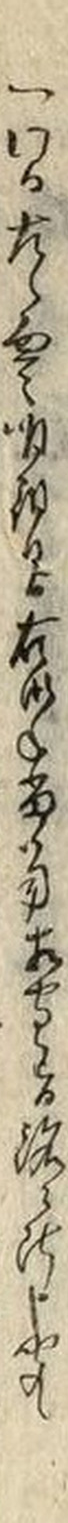一同日左之面々明朔日ゟ右御手当御用相守候旨銘々断申聞候

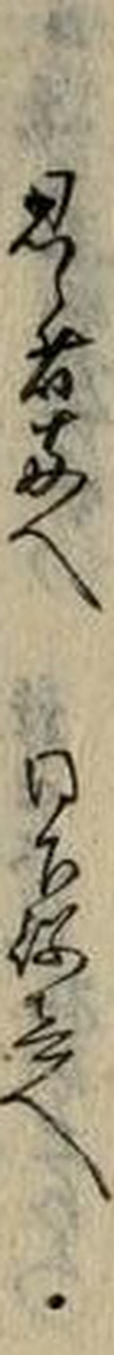忍之者両人同下役壱人
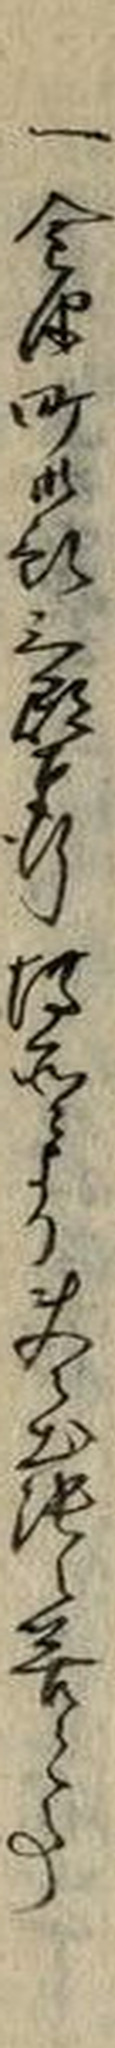一金津町御領三郡奉行場所ニより夫々出張候筈之事
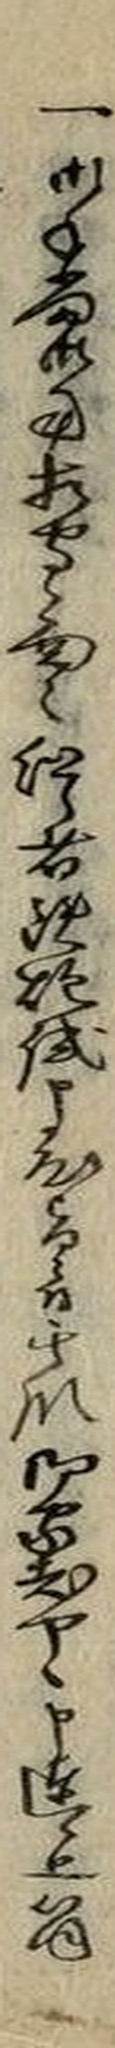一御手当御用相守候面々組之者鉄炮試申度旨ニ付其段御家老中へ申達候上筒
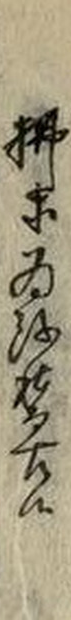払等為致稽古候
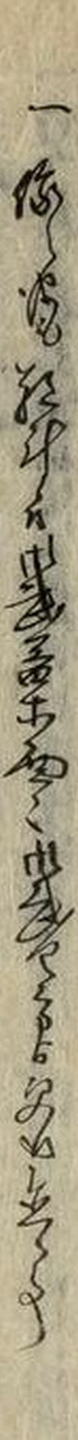一俄之儀も難計ニ付御武器等面々御武具方ゟ受取置候事
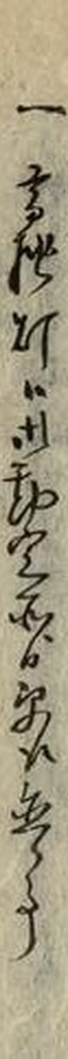一高提灯ハ御勘定所ゟ受取置候事
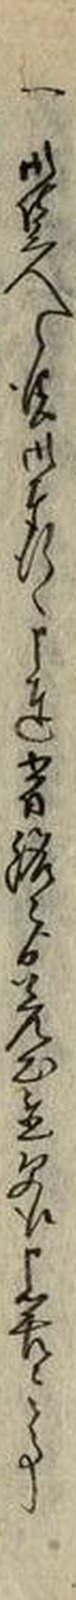一御貸人之儀御奉行へ申達書付銘々ゟ差出置受取申筈ニ候事
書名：御国他国諸事之部
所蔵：福井県文書館 Fukui Prefectural Archives
